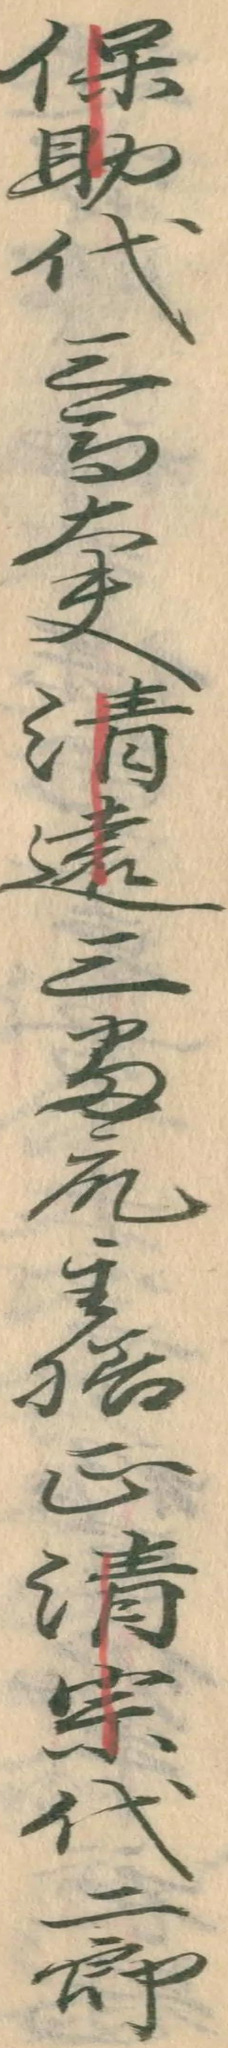保助代三馬大夫清遠三番衆主膳正清宗代二郎
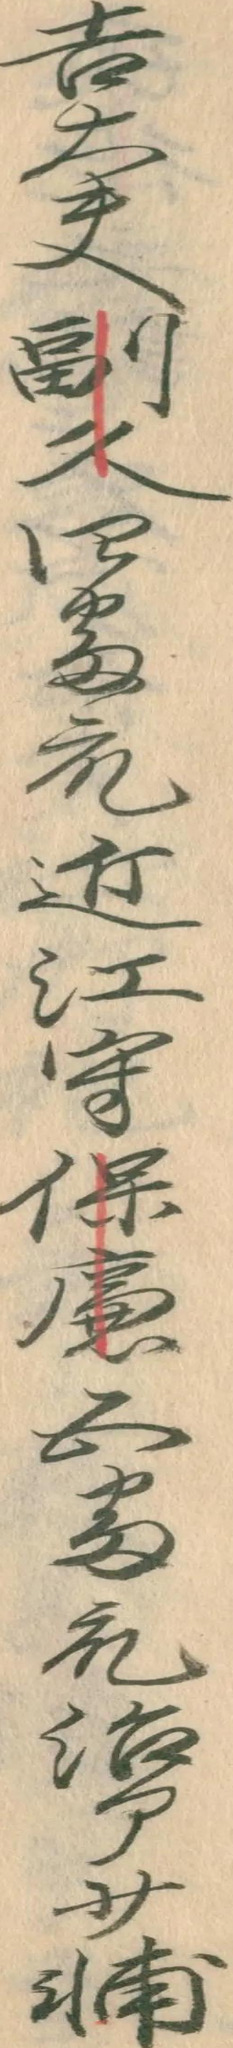吉大夫副久四番衆近江守保廉五番衆治部少輔
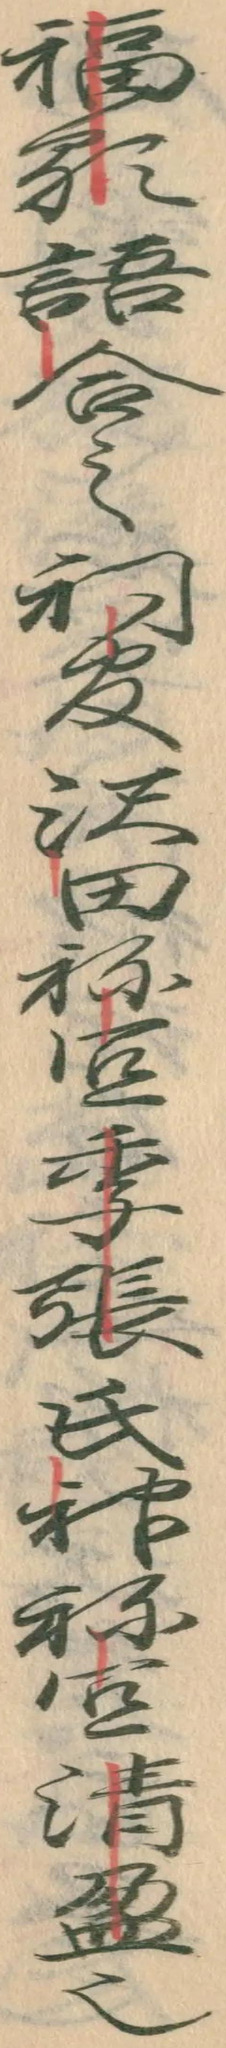福顕語_合之祠-官沢_田祢-宜季張氏_神祢-宜清盈也
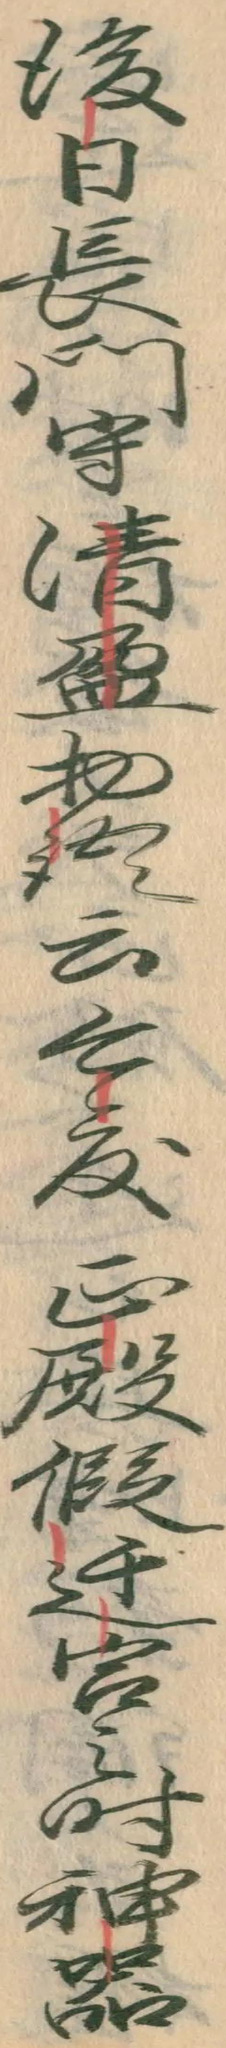後-日長門守清盈物_語云今-度正-殿仮_迁-宮之時神-器
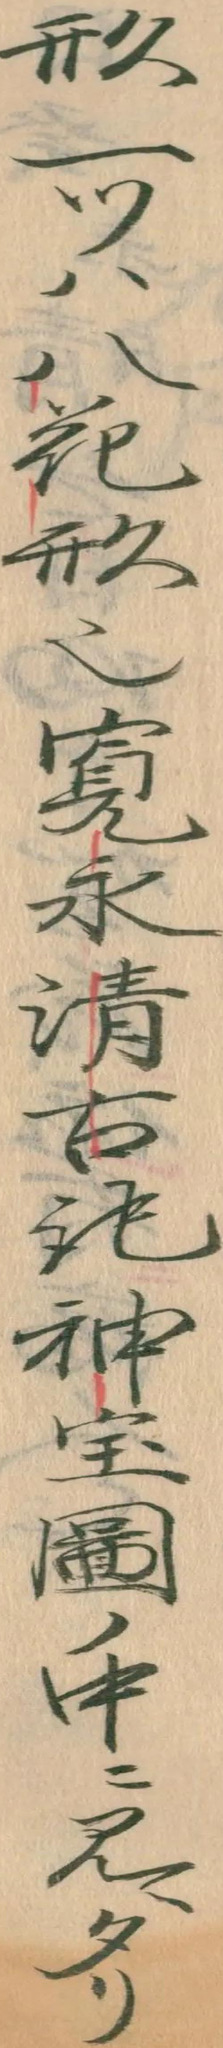形一ツハ八_花_形也寛-永清古記神-宝図ノ中ニ見ヘタリ
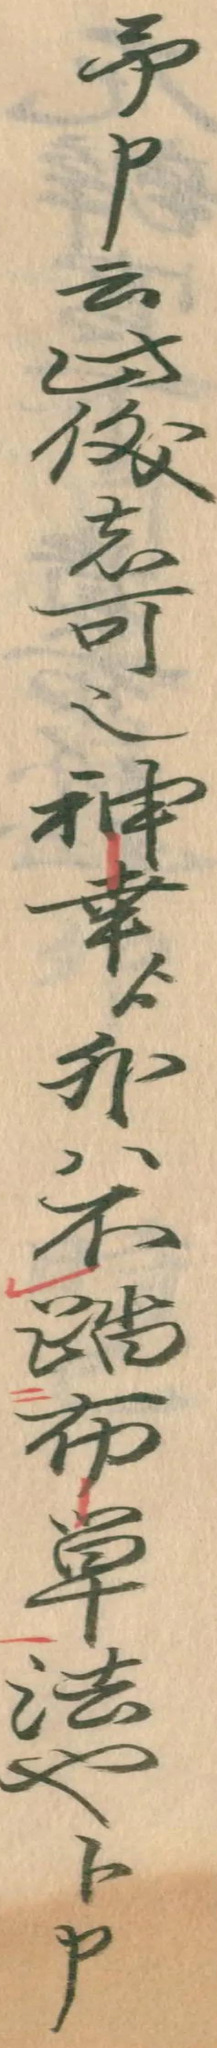予申云此儀者可也神-幸ゟ外ハ不踏布-単法也ト申
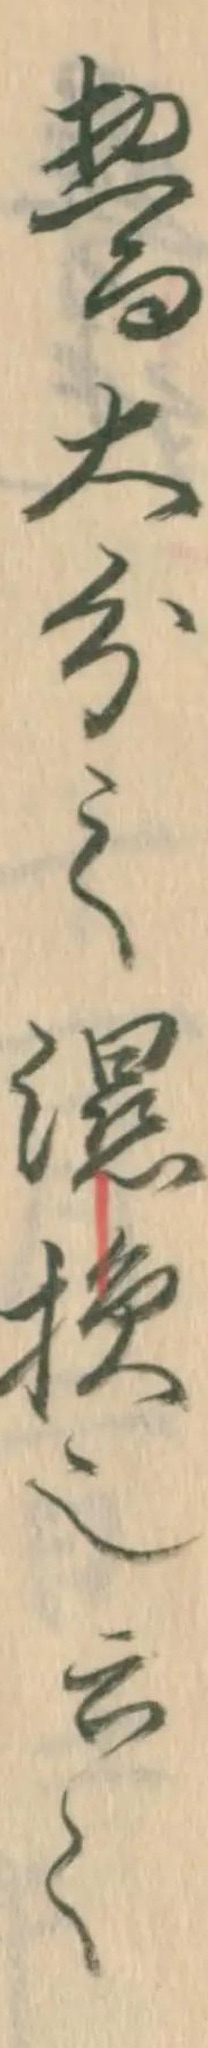惣而大分之湿-損也云々
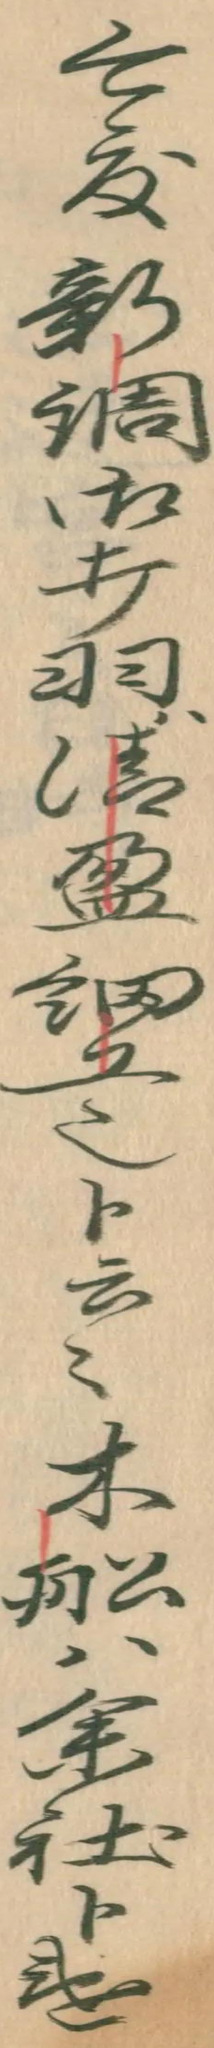今度新-調御打羽ハ清盈細-工也ト云々木_船ハ余社ト違
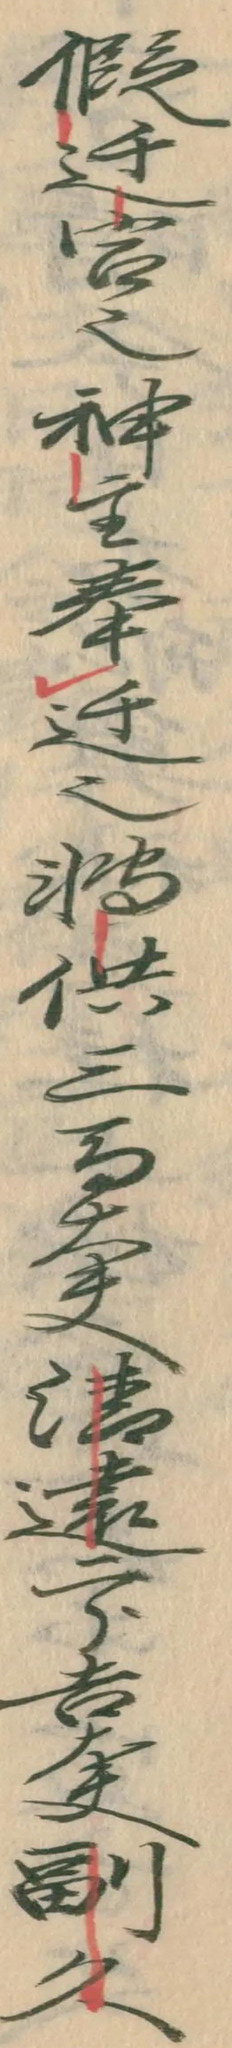仮_迁-宮也神_生奉迁也転-供三馬大夫清遠二郎吉大夫副久
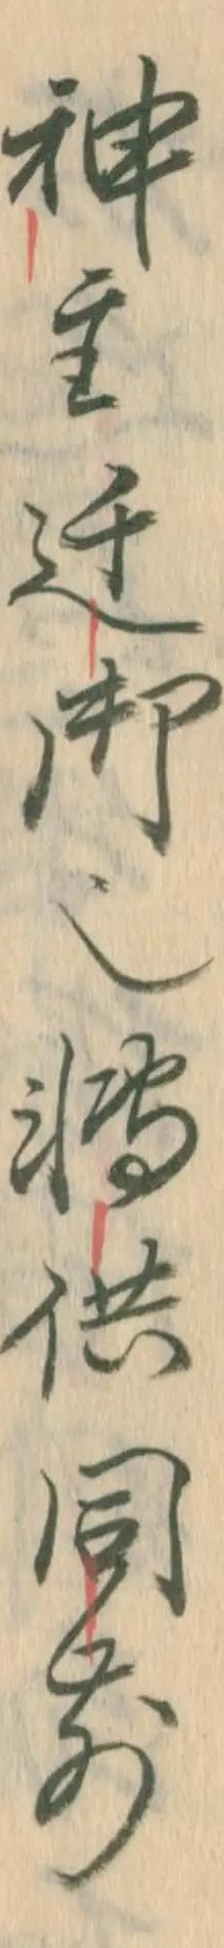神_主迁-御也転-供同-前

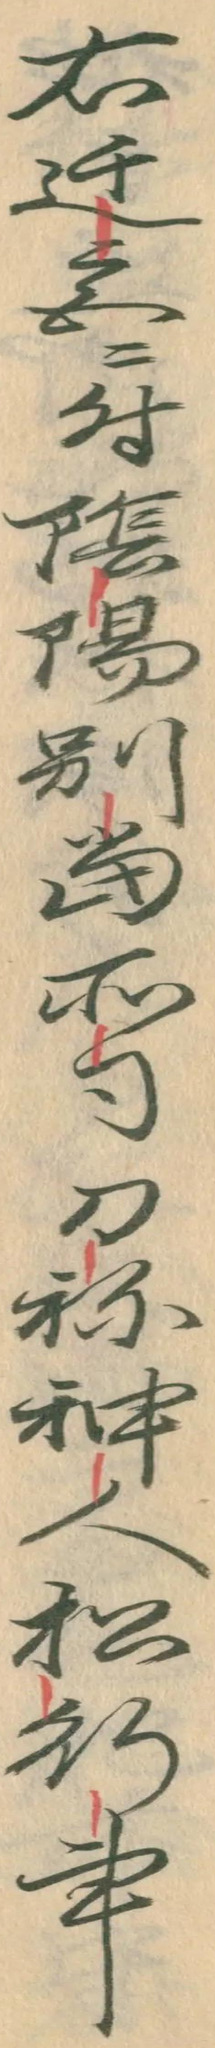右迁-宮ニ付陰-陽別-当所-司刀-祢神-人松_行-事
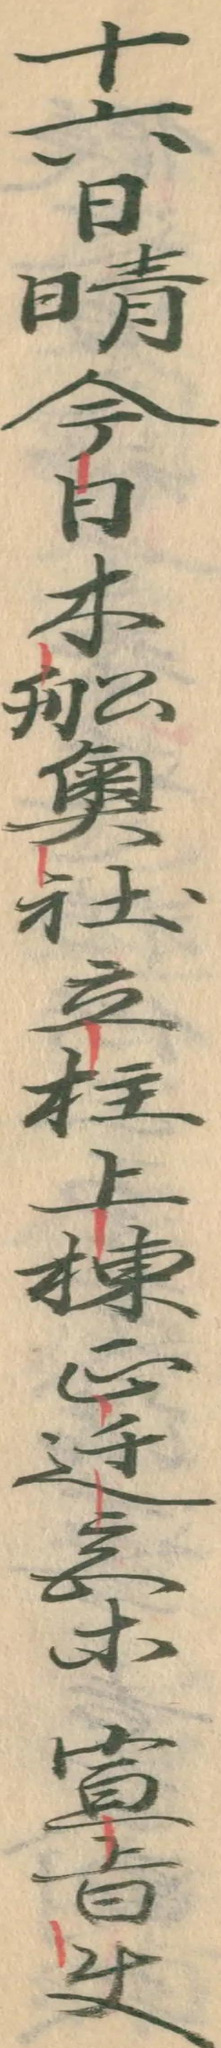十六日晴今-日木-船奥_社立-柱上-棟正-迁-宮等宣-旨_使
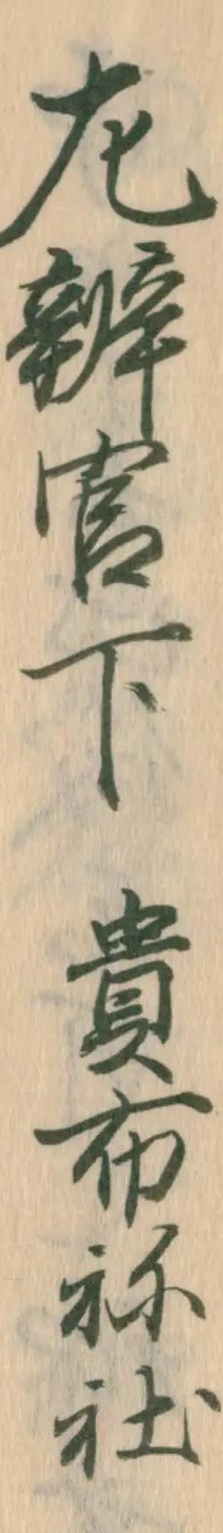左弁官下貴布祢社
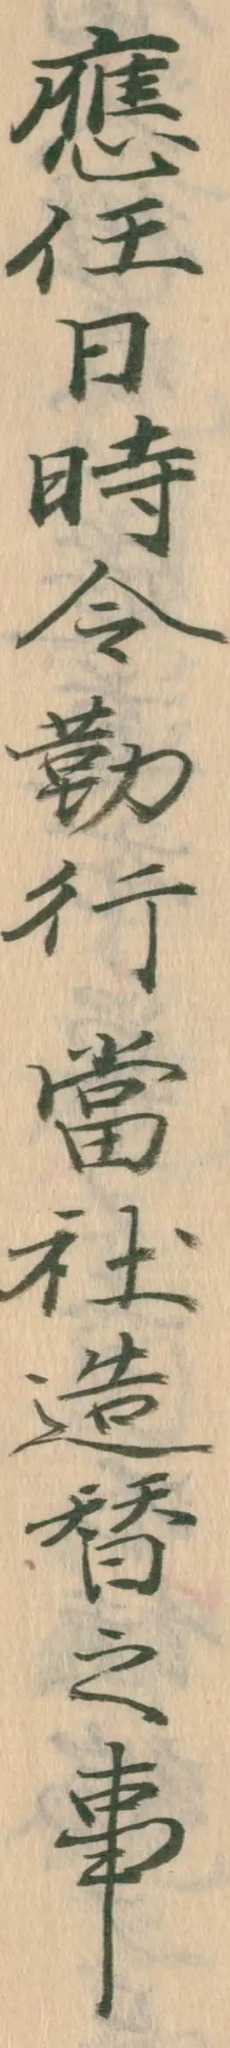応任日時令勤行当社造替之事
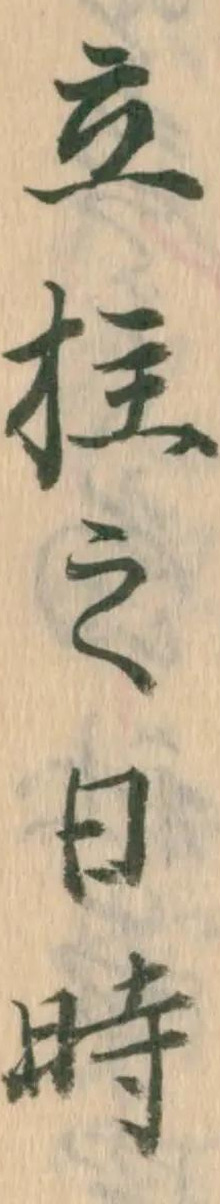立柱之日時
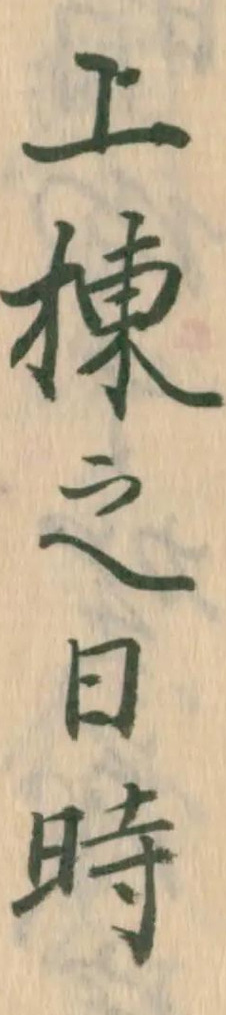上棟之日時
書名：賀茂社記録. 第16冊
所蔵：国立国会図書館 National Diet Library, JAPAN
